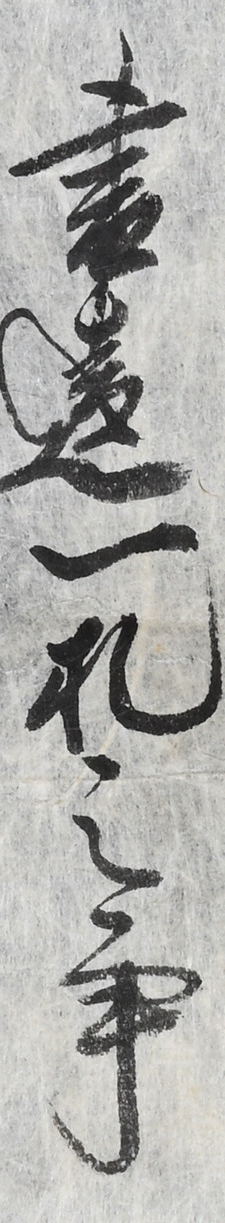書違一札之事
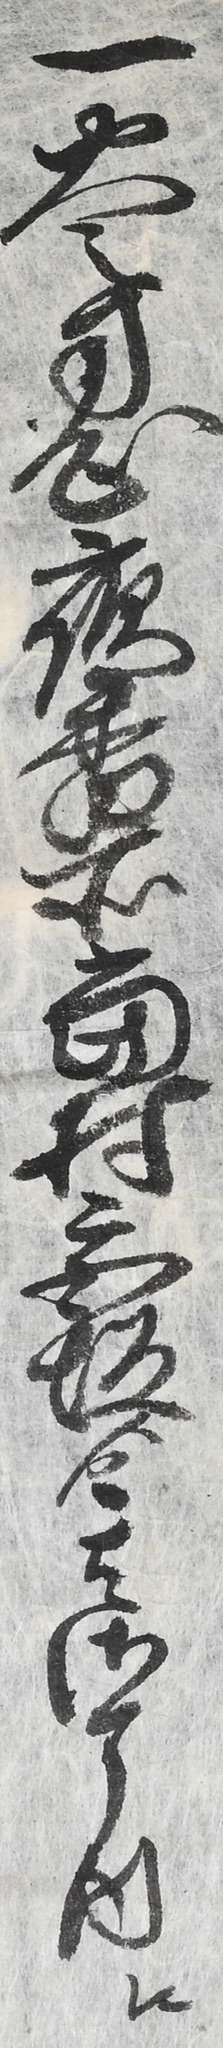一火之用心夜番所当村宮坂ゟ其御町内江
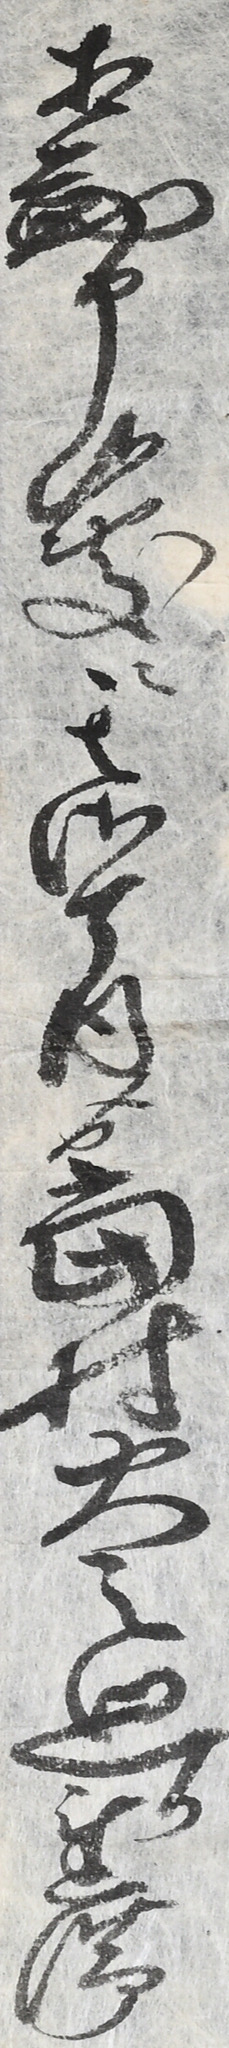相勤申候処ニ其御町内ゟ当村火之廻り遅滞
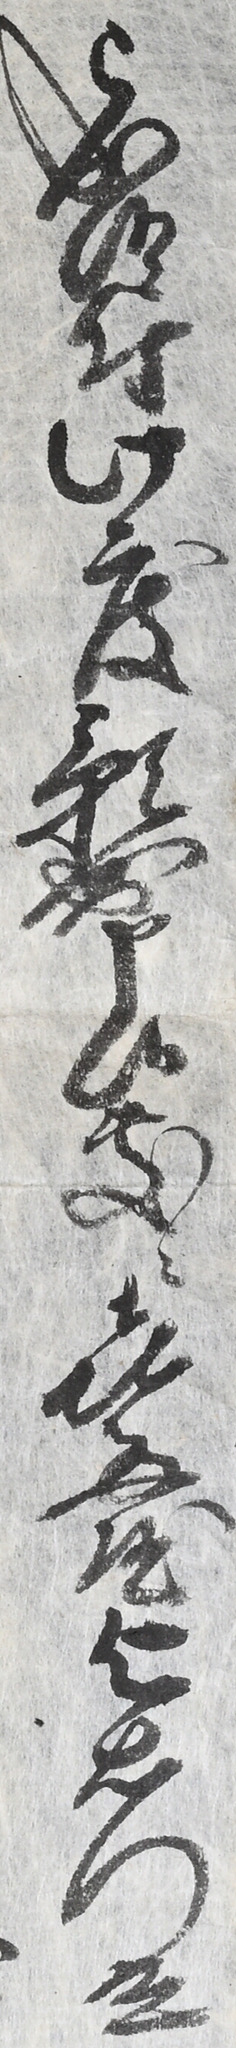被成候ニ付此度願出申候処ニ喜多屋与右衛門殿
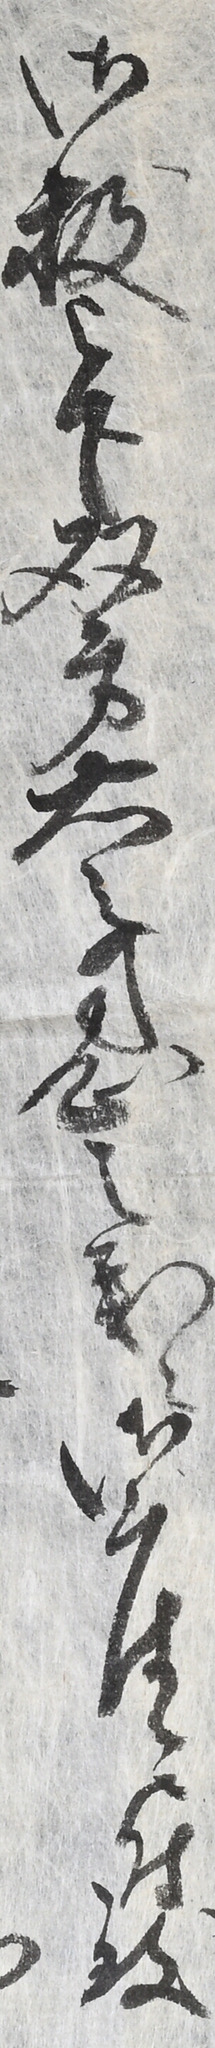御救被下双方火之用心之義ニ御座候ニ付致
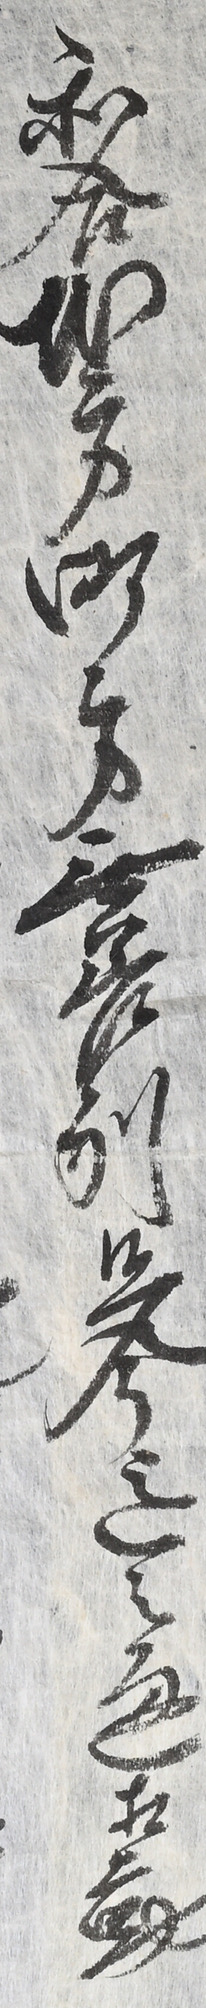和合地方町方無差別只今迄之通相勤
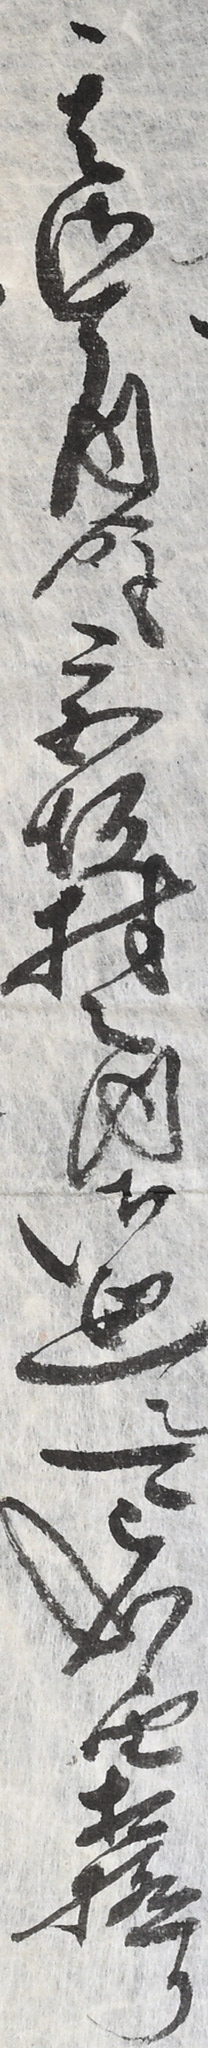其御町内ゟも宮坂村之内御廻シ可被成由相極り
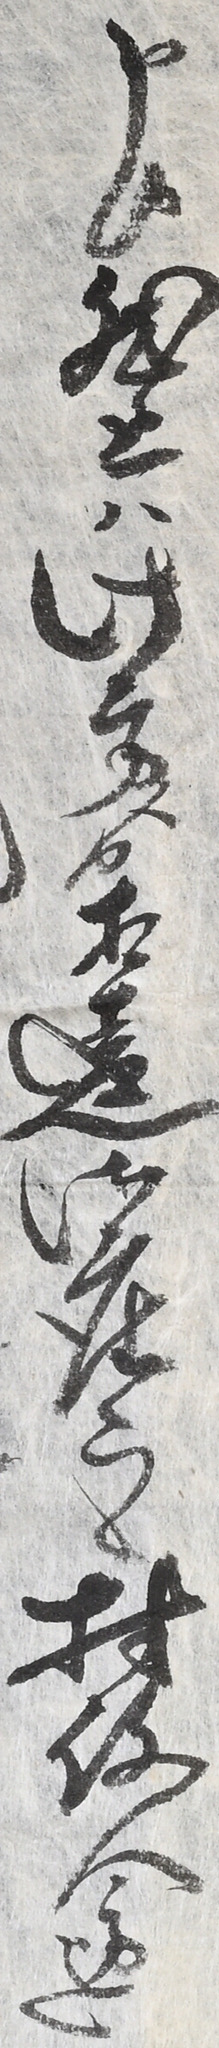申候然上ハ此方ゟ相違御座候ハヽ村役人方迄
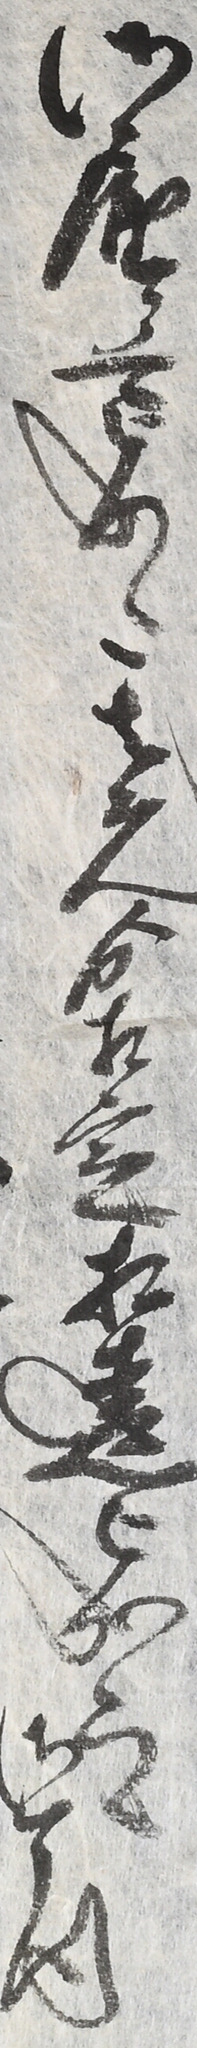御届ヶ可被成候其元ゟ相定相違被成候ハヽ御町内
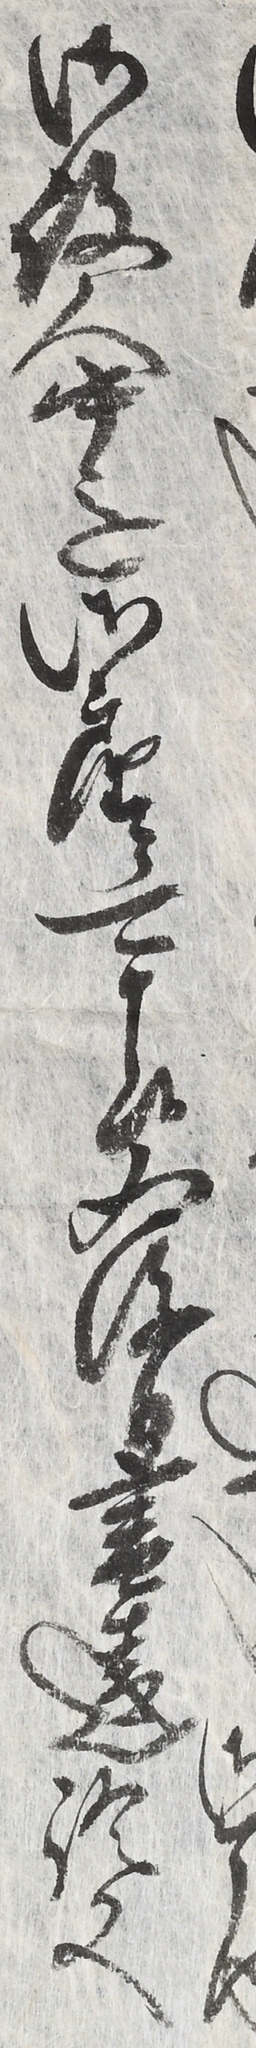御役人中迄御届ヶ可申候為後日書違証文
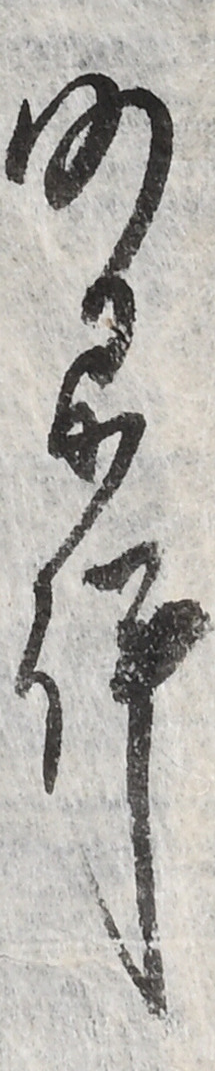仍而如件
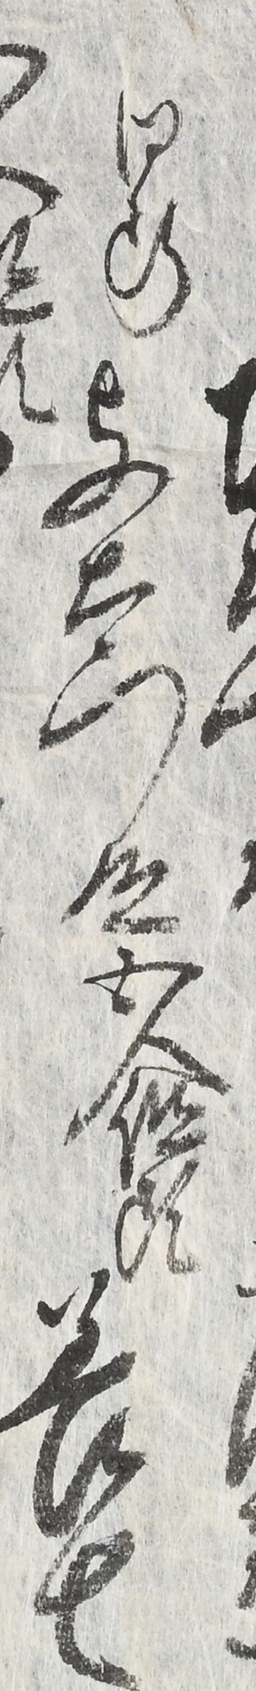同断与右衛門殿善七
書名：書違一札之事
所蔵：伊那市立高遠町図書館・合同会社AMANE
